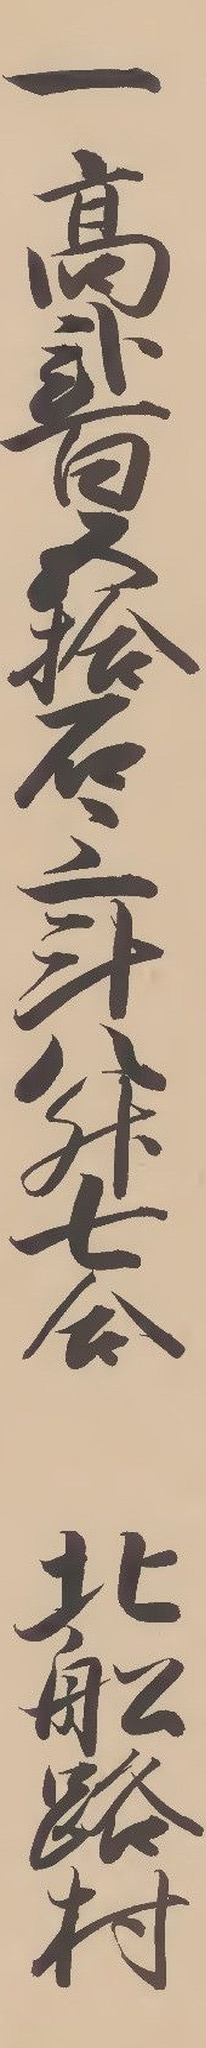一高弐百五拾石三斗八升七合北船路村

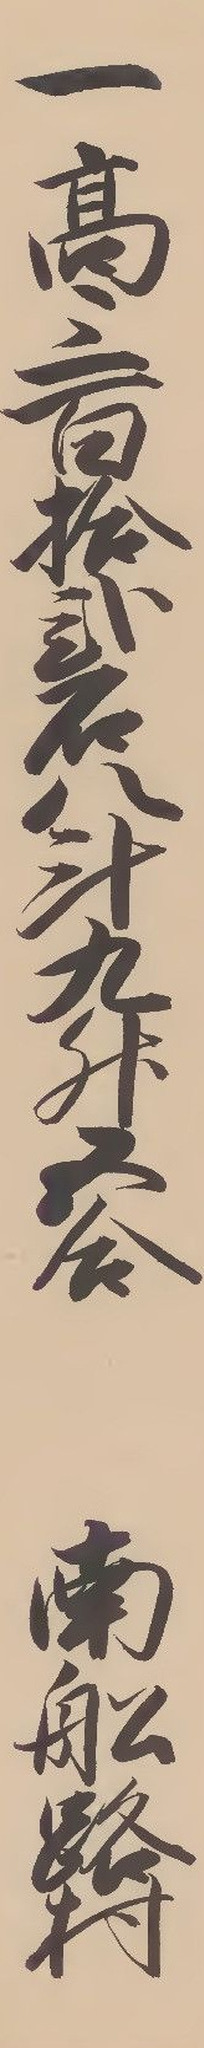一高三百拾弐石八斗九升五合南船路村

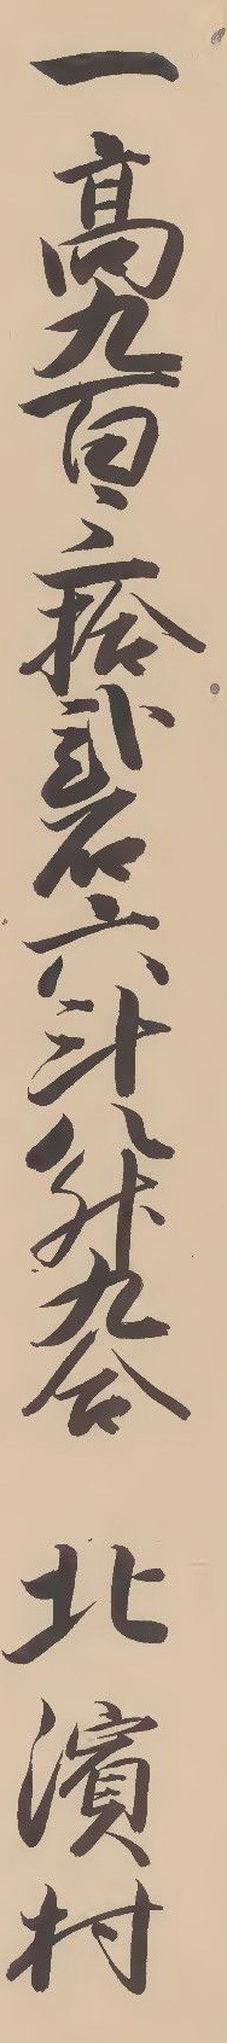一高九百三拾弐石六斗八升九合北浜村
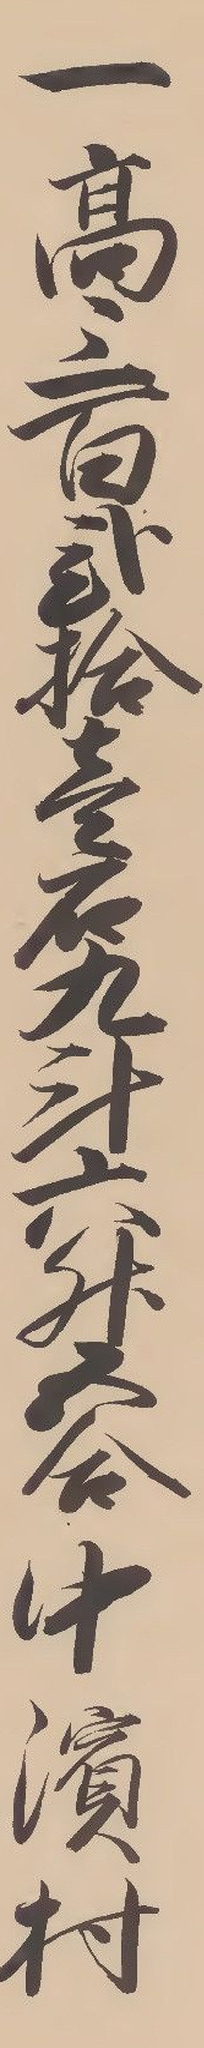一高三百弐拾壱石九斗六升五合中浜村
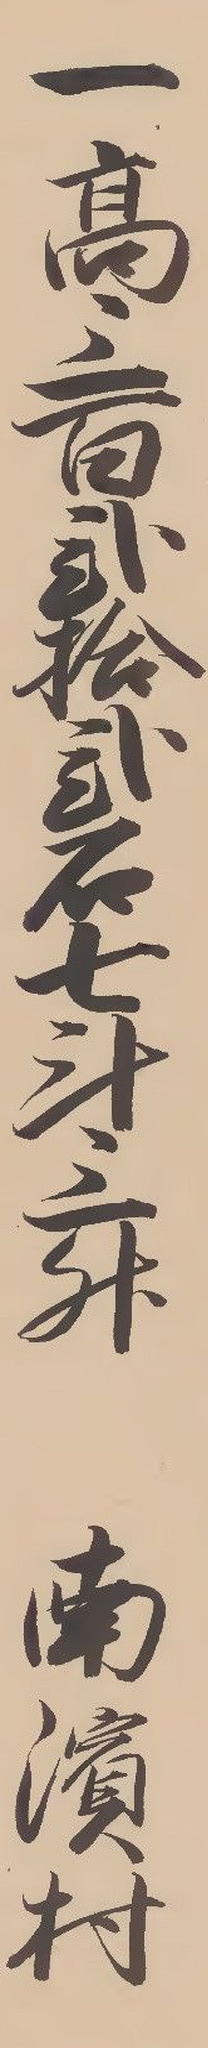一高三百弐拾弐石七斗三升南浜村
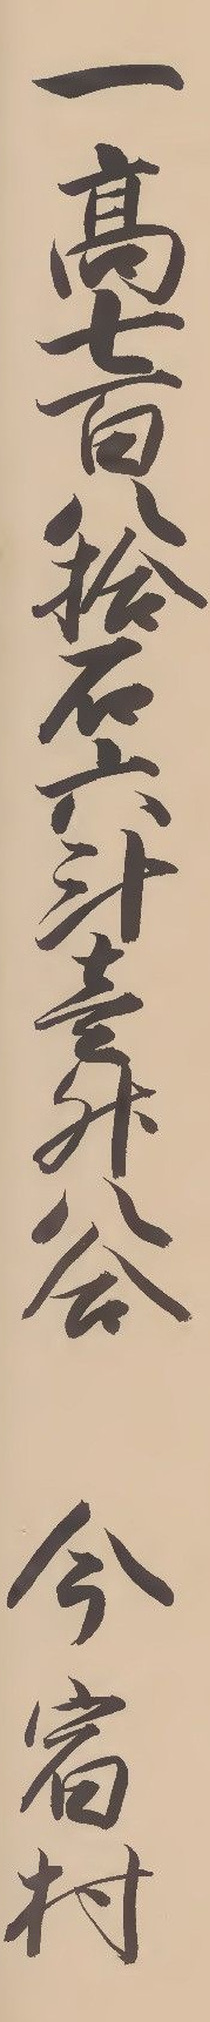一高七百八拾石六斗壱升八合今宿村
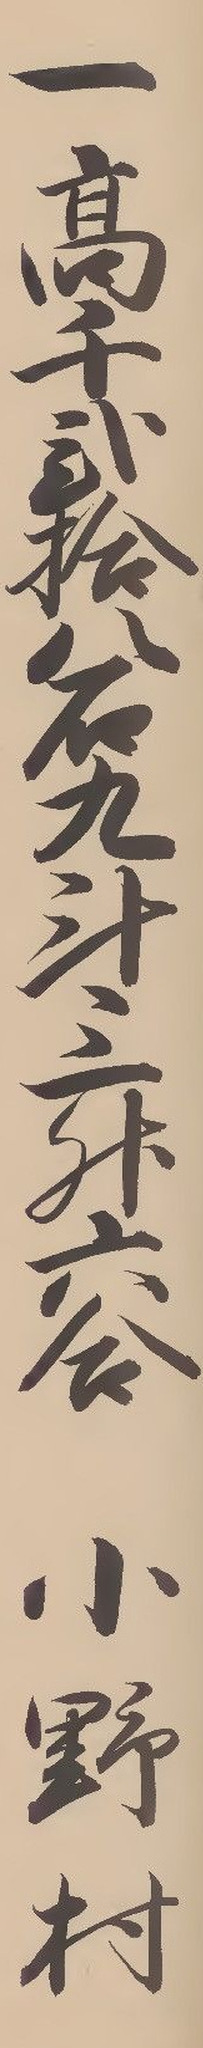一高千弐拾八石九斗三升六合小野村
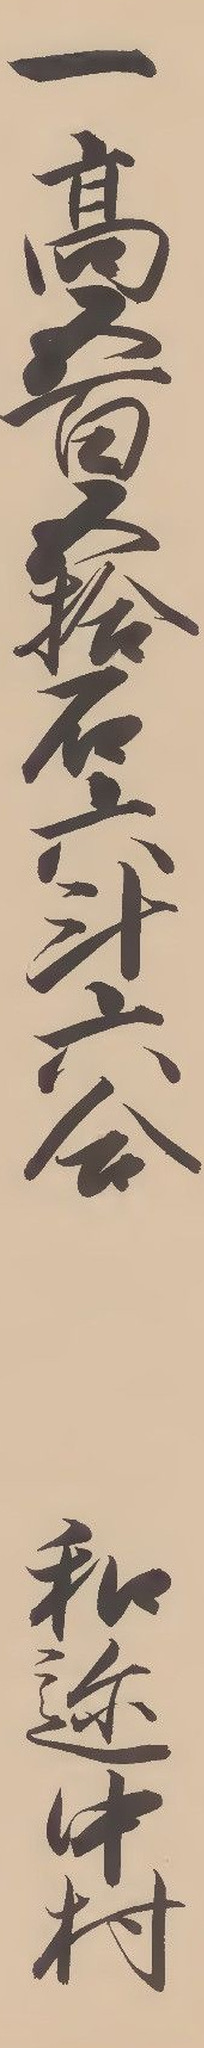一高五百五拾石六斗六合和迩中村
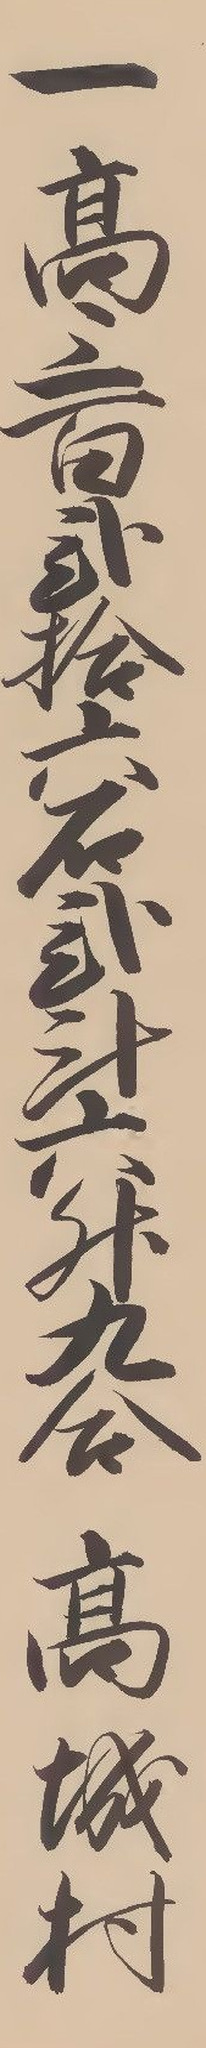一高三百弐拾六石弐斗六升九合高城村
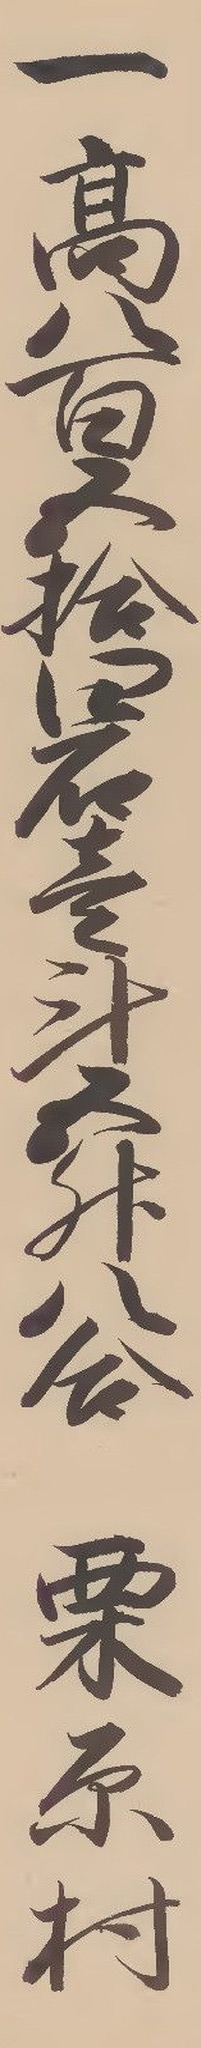一高八百五拾四石壱斗五升八合栗原村

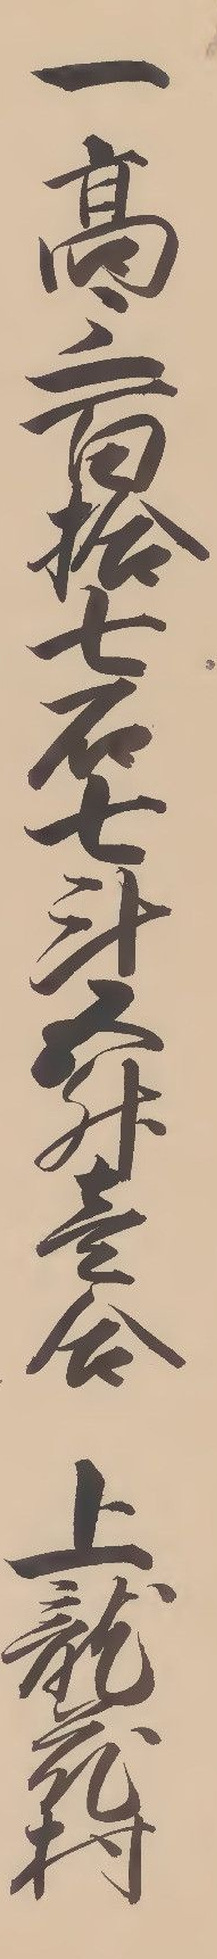一高三百拾七石七斗五升壱合上竜花村
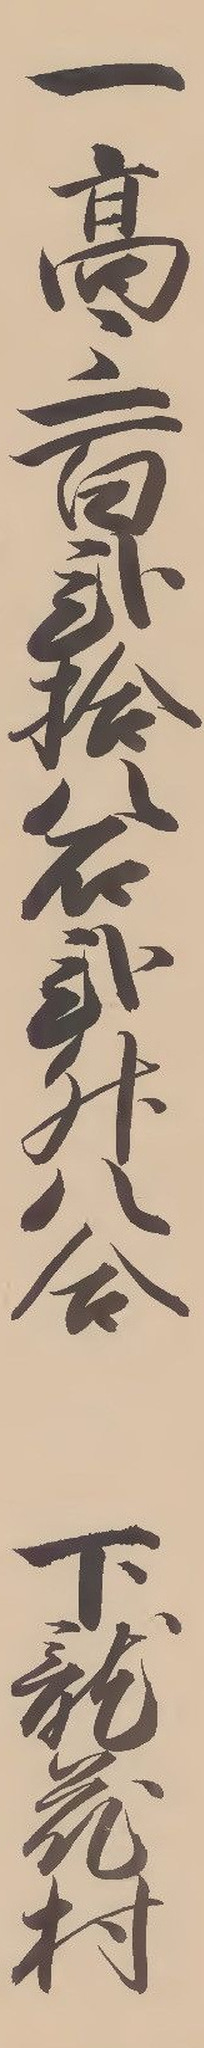一高三百弐拾八石弐升八合下竜花村
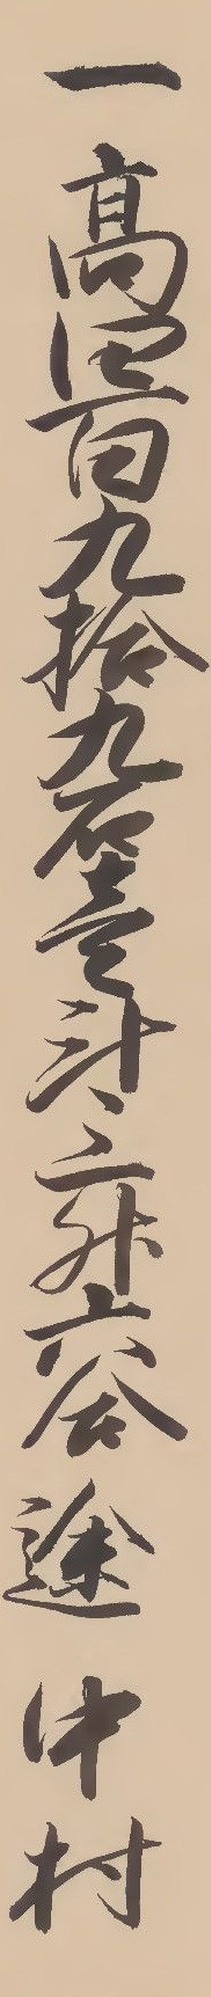一高四百九拾九石壱斗三升六合途中村

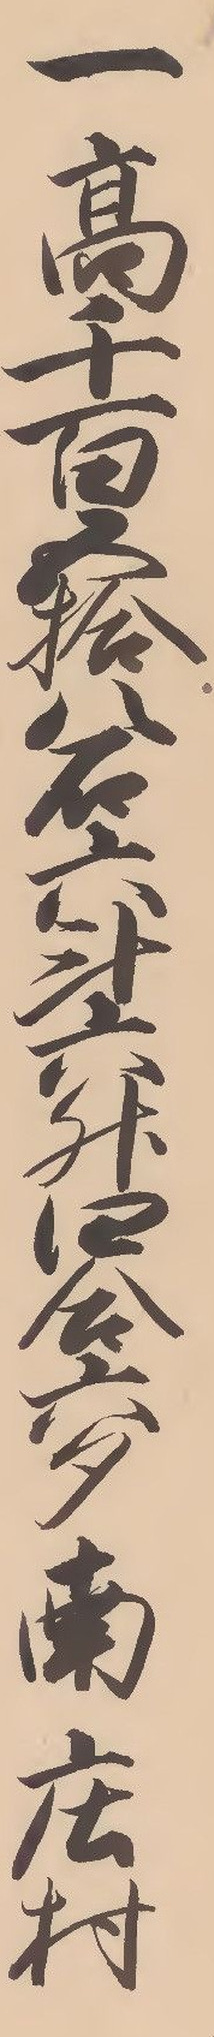一高千百五拾八石六斗六升四合六勺南庄村
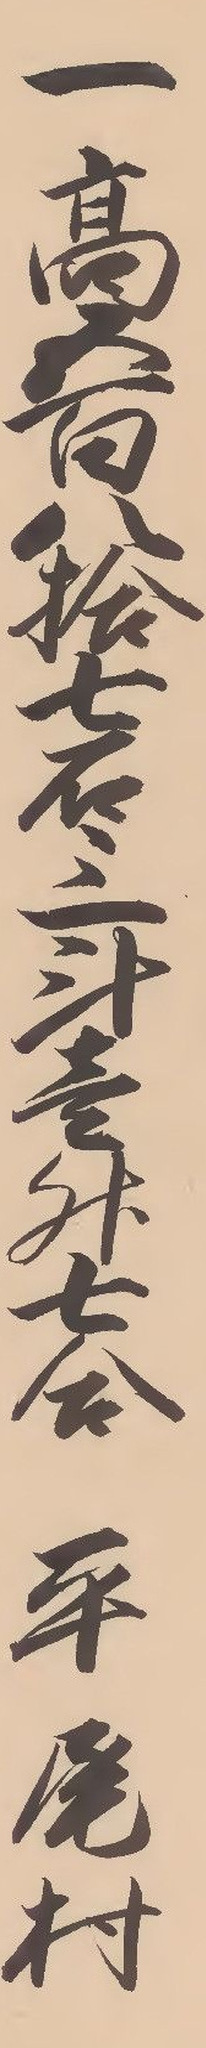一高五百八拾七石三斗壱升七合平尾村
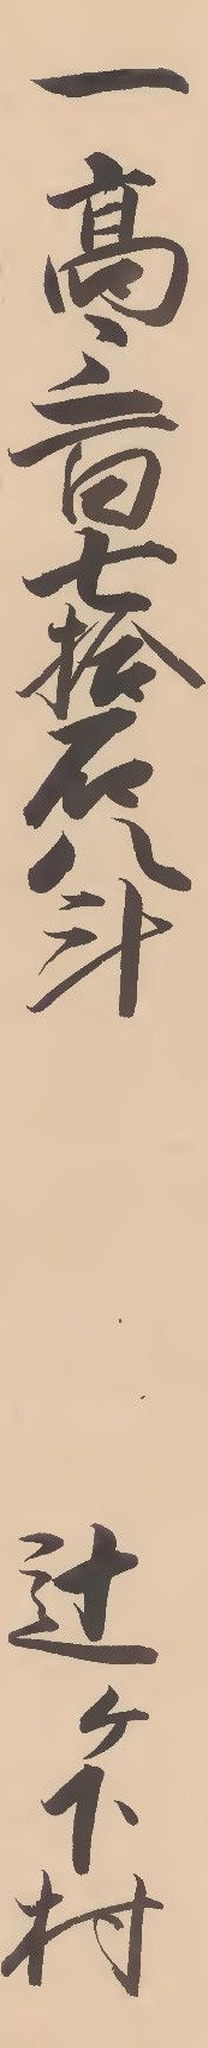一高三百七拾石八斗辻ケ下村
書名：近江国郷帳
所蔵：国立公文書館 National Archives of Japan
